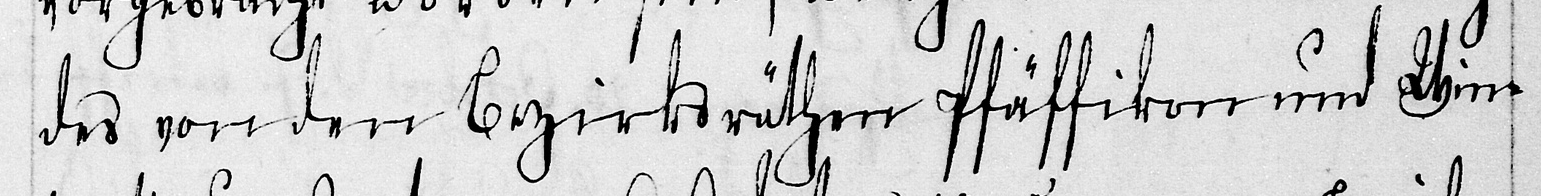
des von den Bezirksräthen Pfäffikon und Win¬
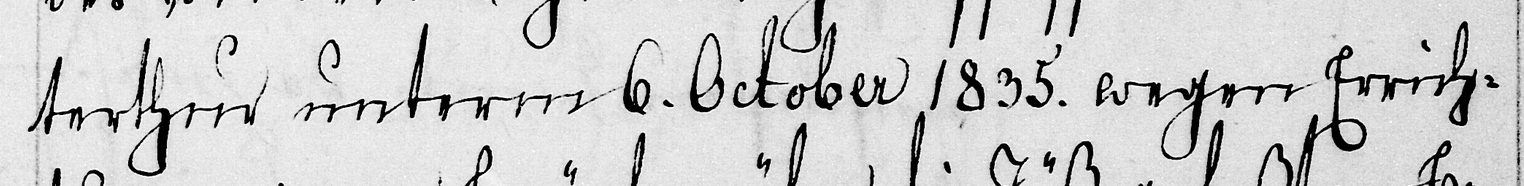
terthur unterm 6. October 1835. wegen Errich¬
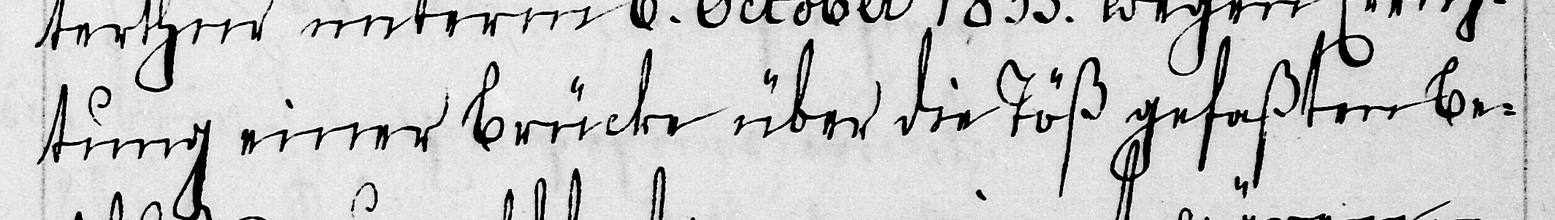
tung einer Brücke über die Töß gefaßten Be¬
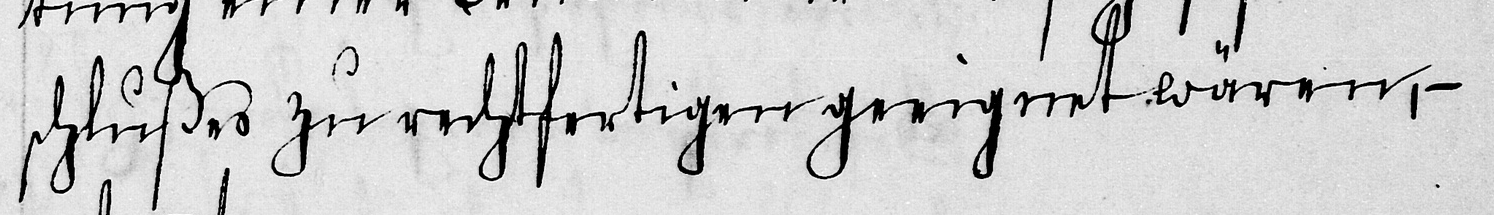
schlußes zu rechtfertigen geeignet wären, –
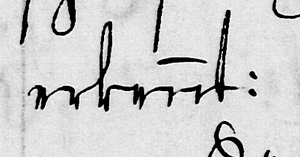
erkennt:
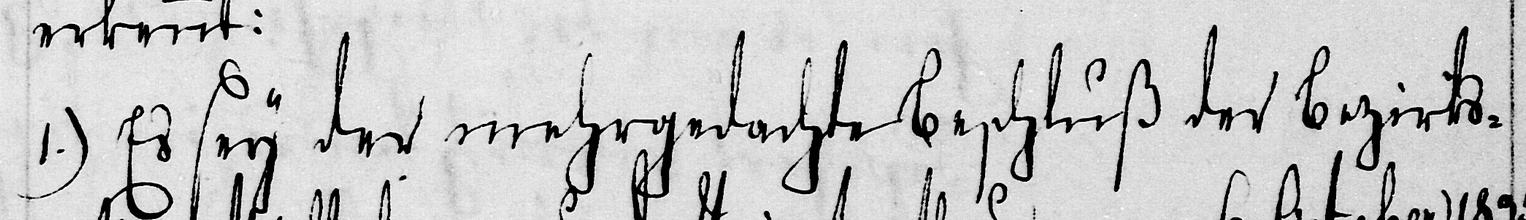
1.) Es sey der mehrgedachte Beschluß der Bezirks¬
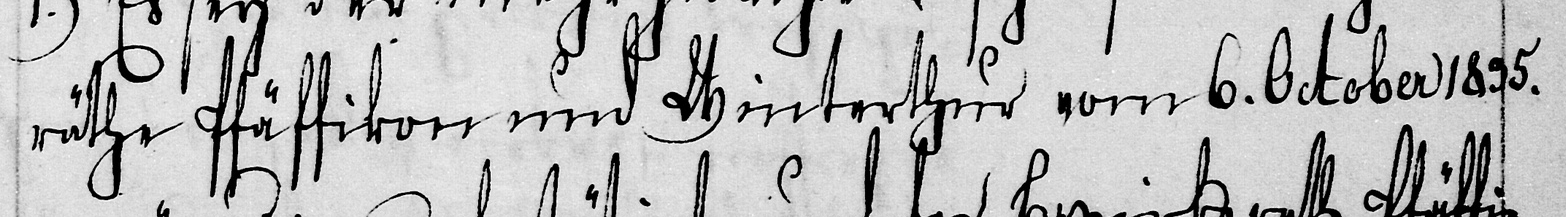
räthe Pfäffikon und Winterthur vom 6. October 1835.
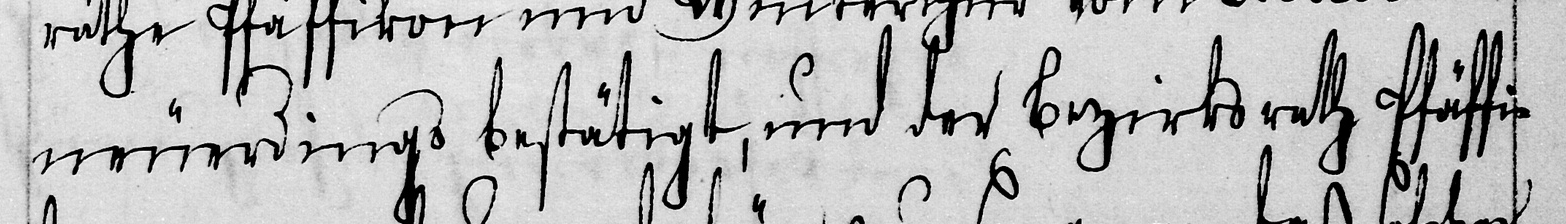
neuerdings bestätigt, und der Bezirksrath Pfäff¬
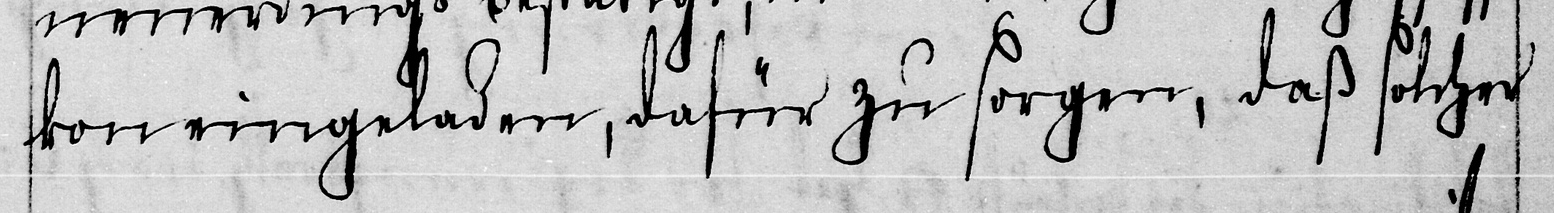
ikon eingeladen, dafür zu sorgen, daß solcher
